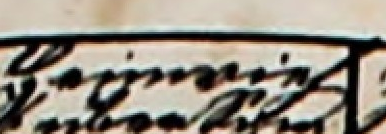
Heimvieh
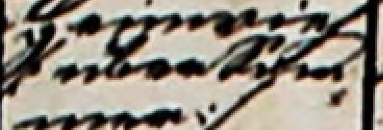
/: über Sum„
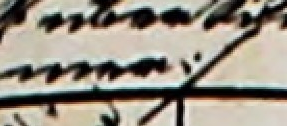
mer :/
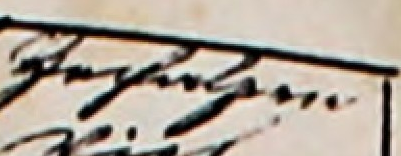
Hochatzen„
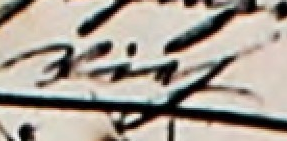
vieh
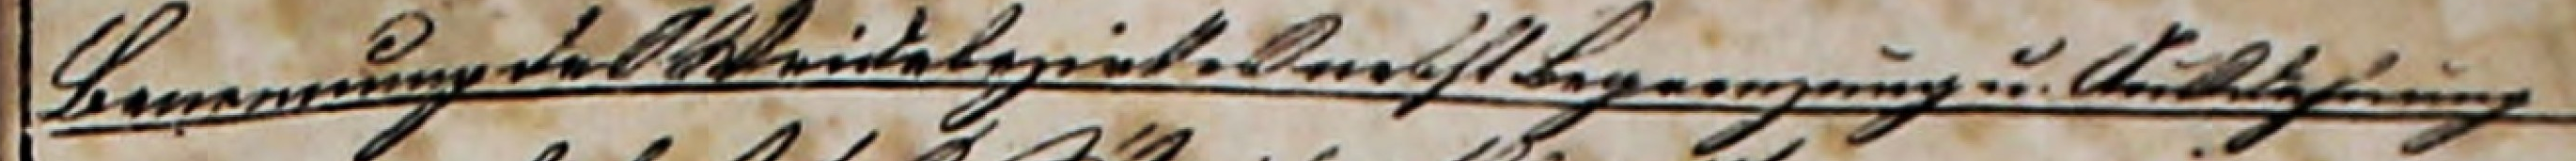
Benennung des Weidebezirkes nebst Begrenzung u. Ausdehnung
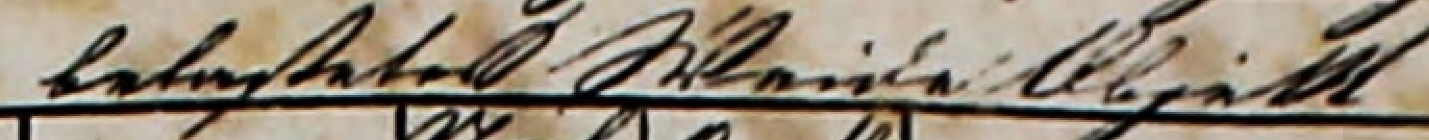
belastetes Weide Objekt
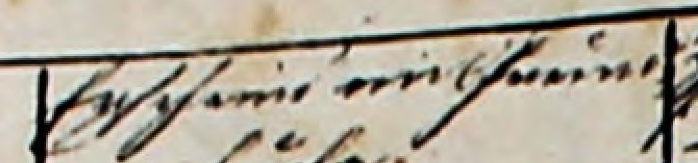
Erscheint im Grund„
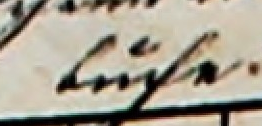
buche.
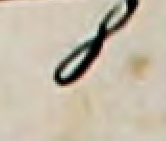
8
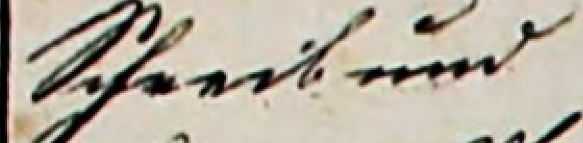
Schreib und
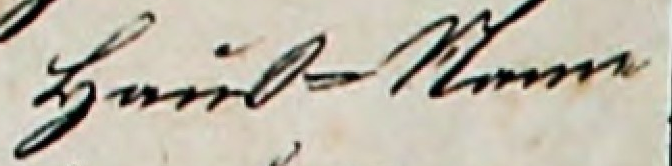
Haus = Name
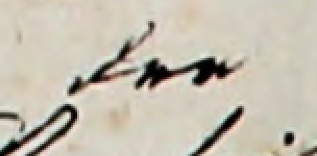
der
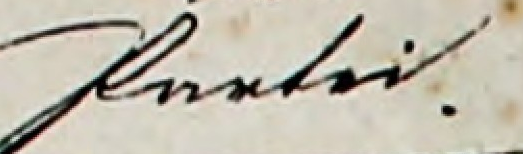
Partei
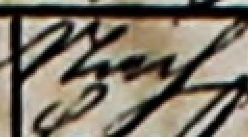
Noch
